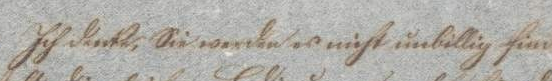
Ich denke, Sie werden es nicht unbillig finden,
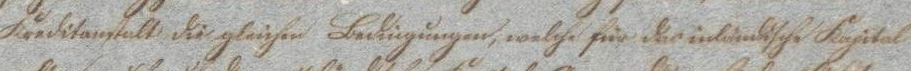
Kreditanstalt die gleichen Bedingungen, welche für das inländische Kapital
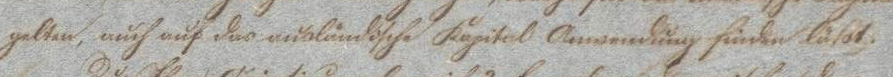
gelten, auch auf das ausländische Kapital Anwendung finden läßt.
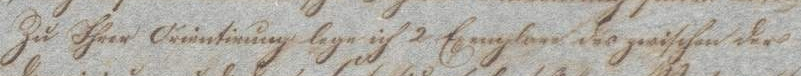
Zu Ihrer Orientirung lege ich 2 Exemplare des zwischen der
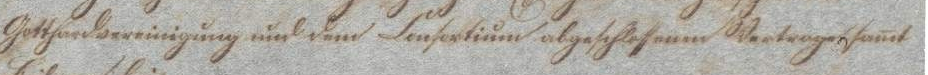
Gotthardvereinigung und dem Consortium abgeschlossenen Vertrages sammt
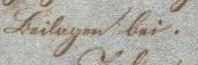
Beilagen bei.
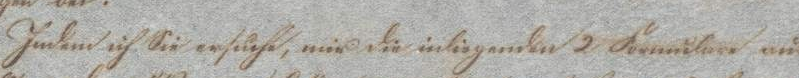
Indem ich Sie ersuche, mir die inliegenden 2 Formulare aus-
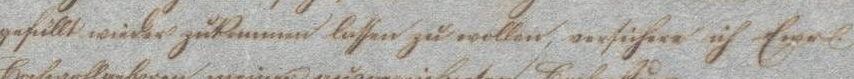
gefüllt wieder zukommen lassen zu wollen, versichere ich Ewr.
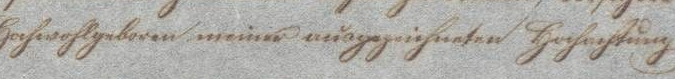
Hochwohlgeboren meiner ausgezeichneten Hochachtung
